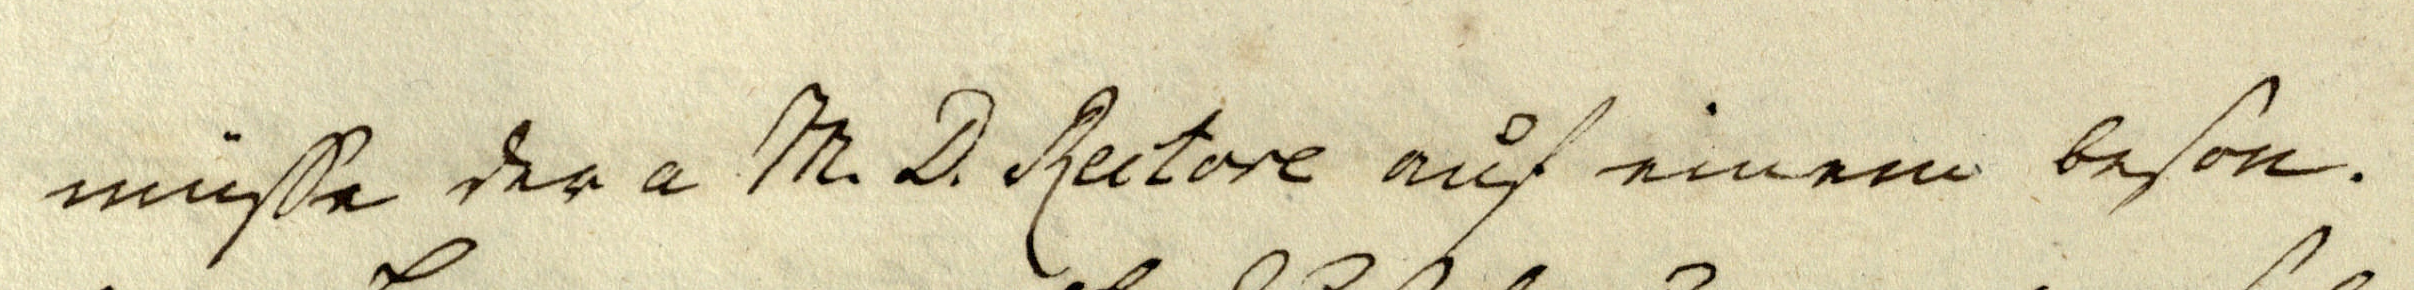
müsse der a M. D. Rectore auf einem beson¬
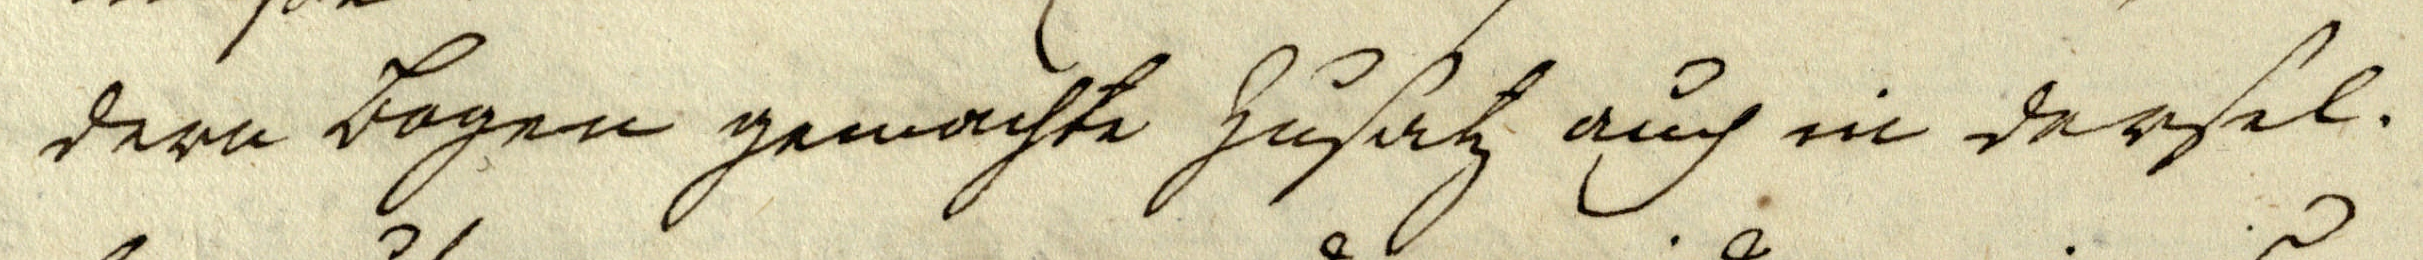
dern Bogen gemachte Zusatz auch in dersel¬
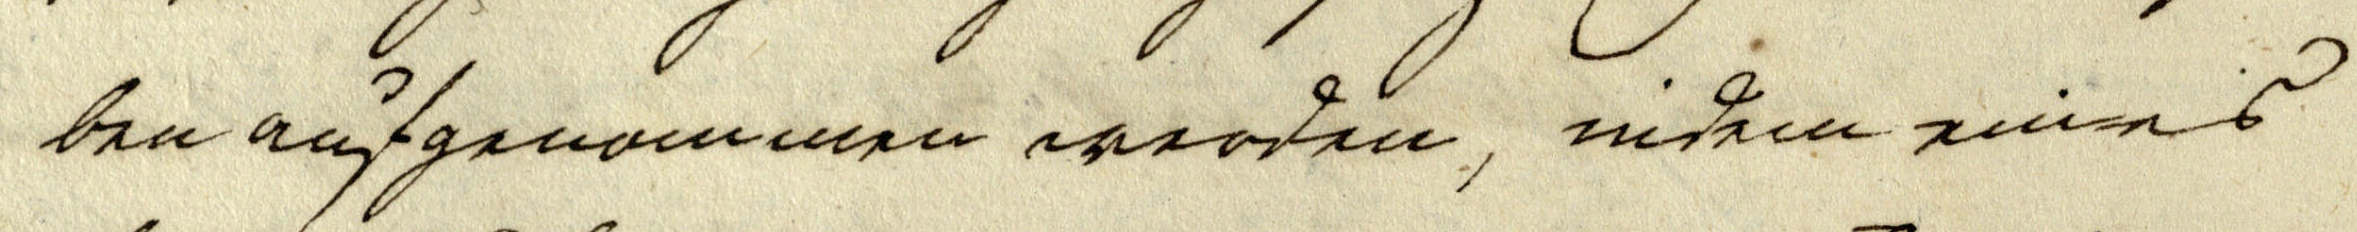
ben auf genommen werden, indem eines
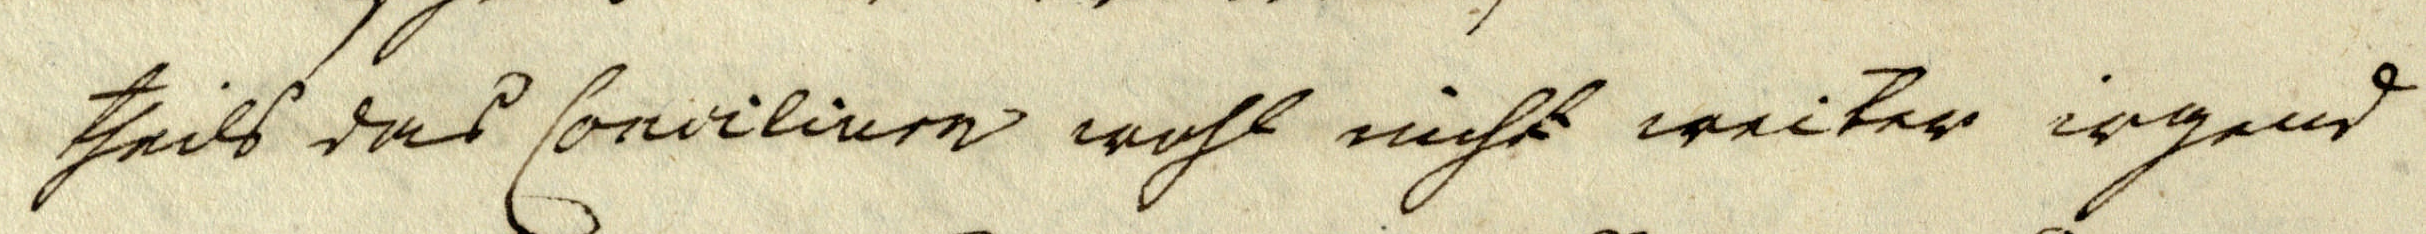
theils das Concilium wohl nicht weiter irgend
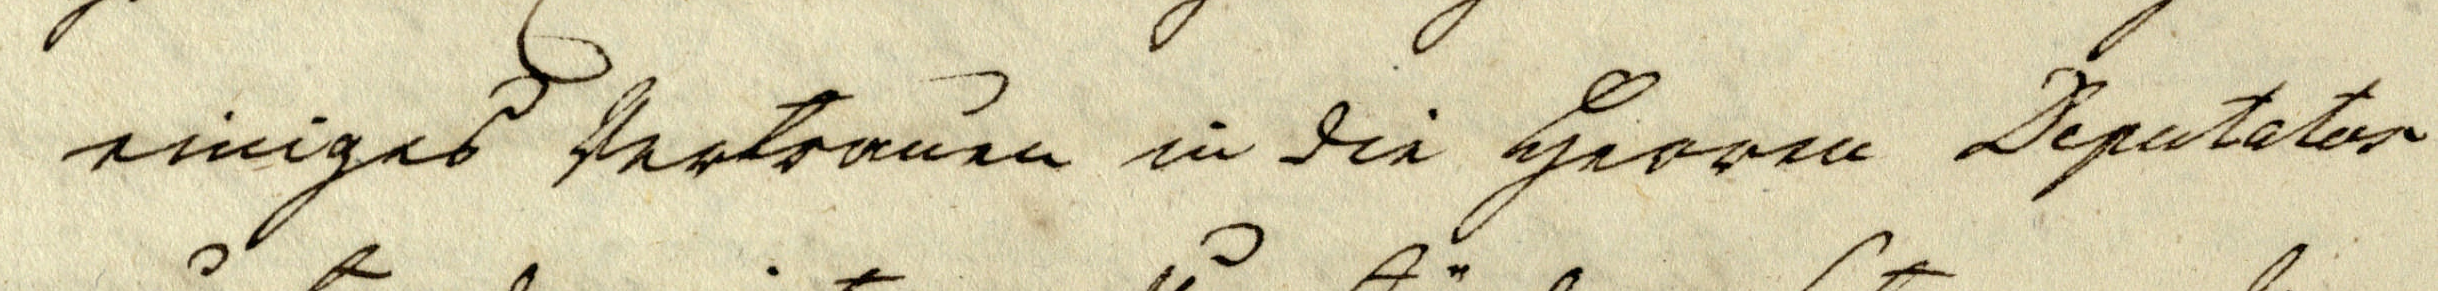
einiges Vertrauen in die Herren Deputatos
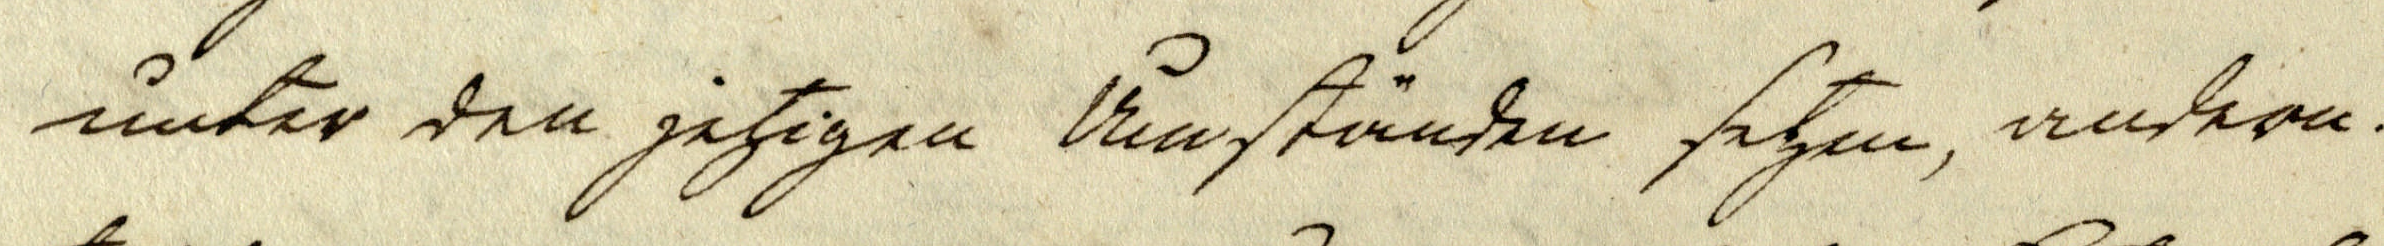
unter den jetzigen Umständen setzen, andern¬
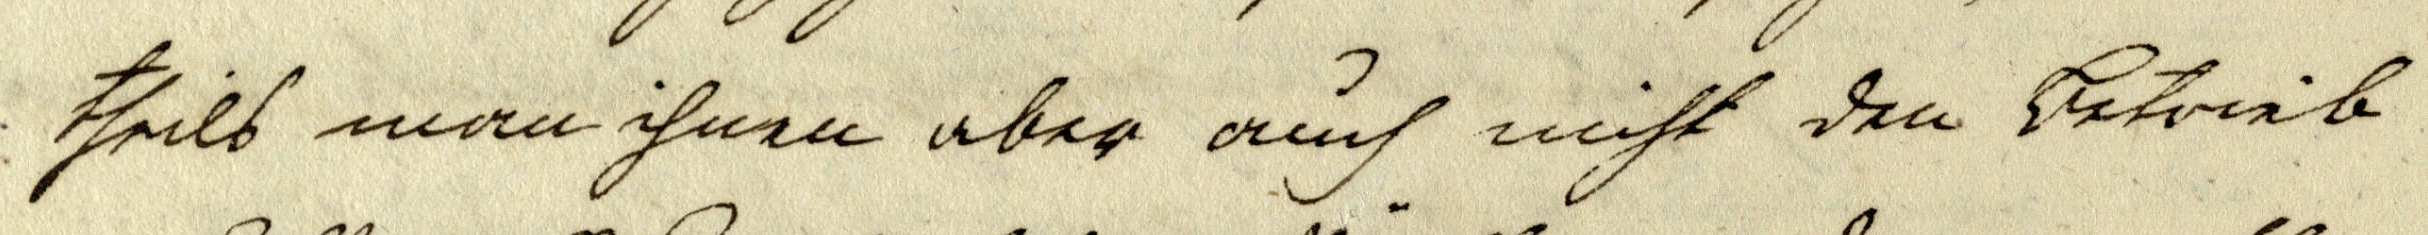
theils man ihnen aber auch nicht den Betrieb
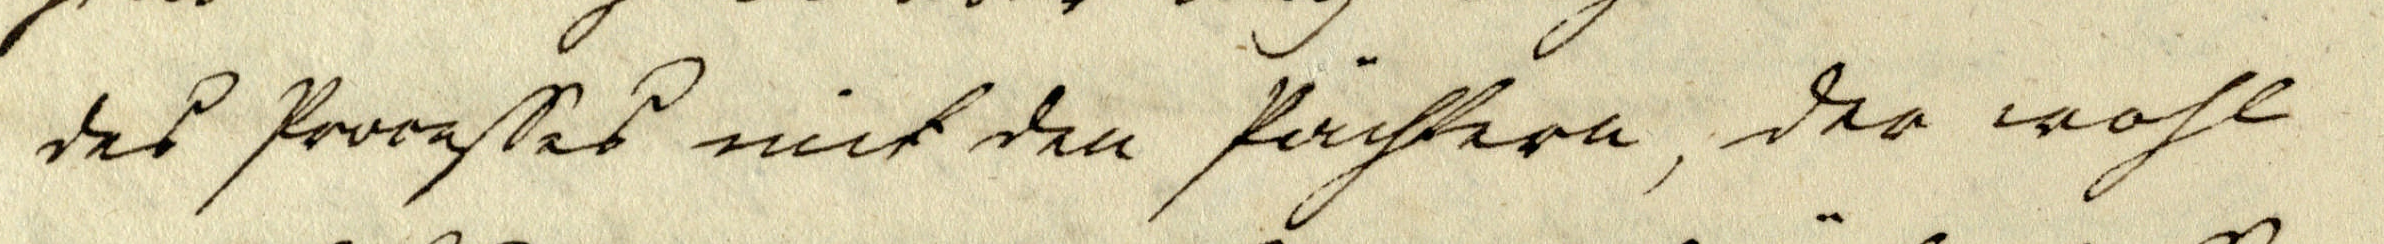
des Processes mit den Pächtern, der wohl
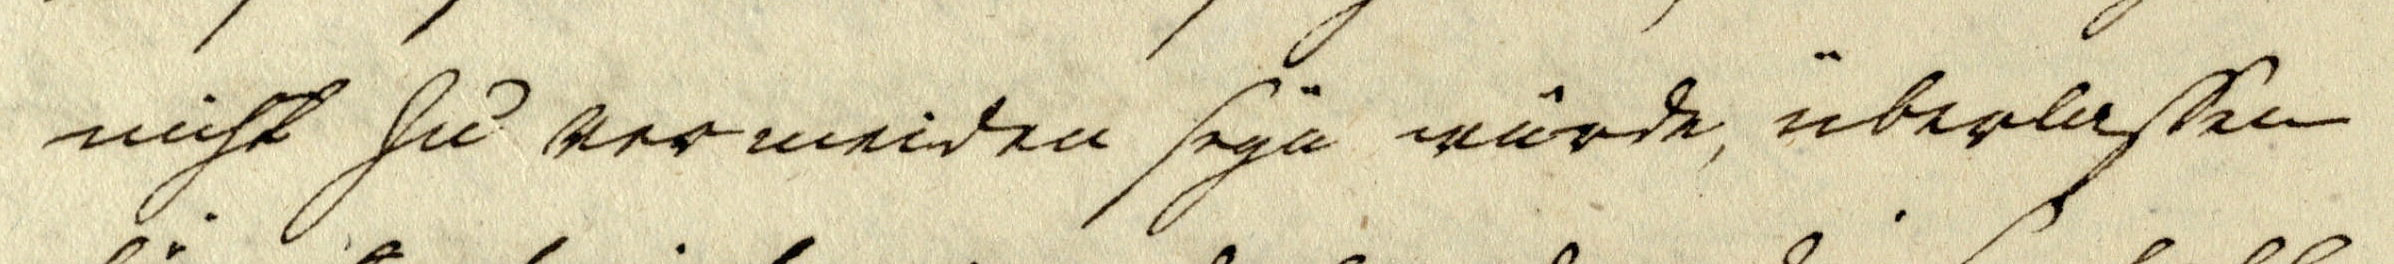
nicht zu vermeiden seÿn würde, überlassen
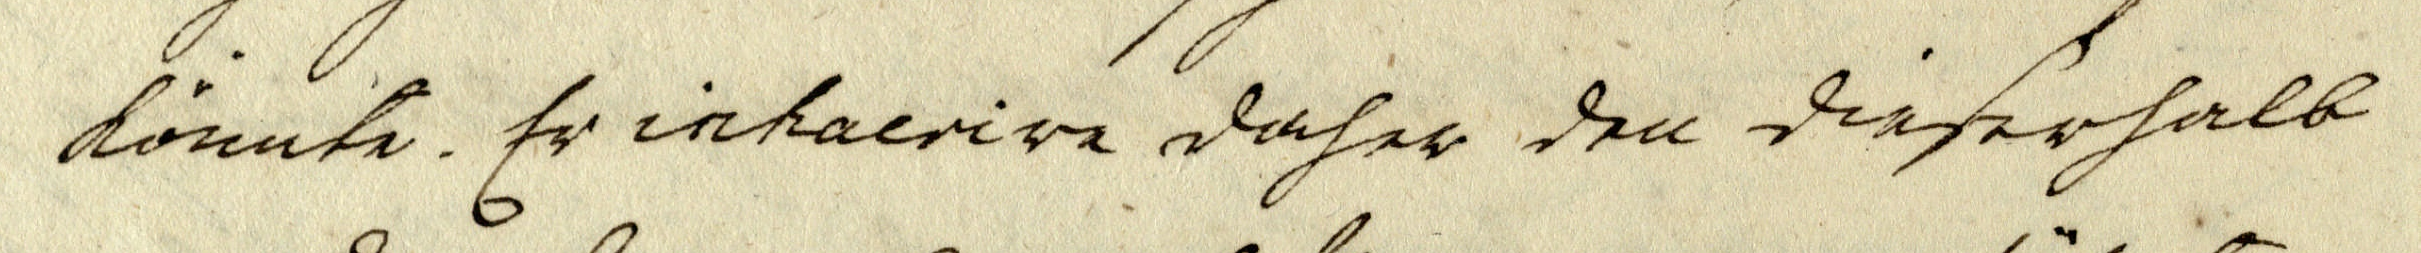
könnte. Er inhaerire daher den dieserhalb
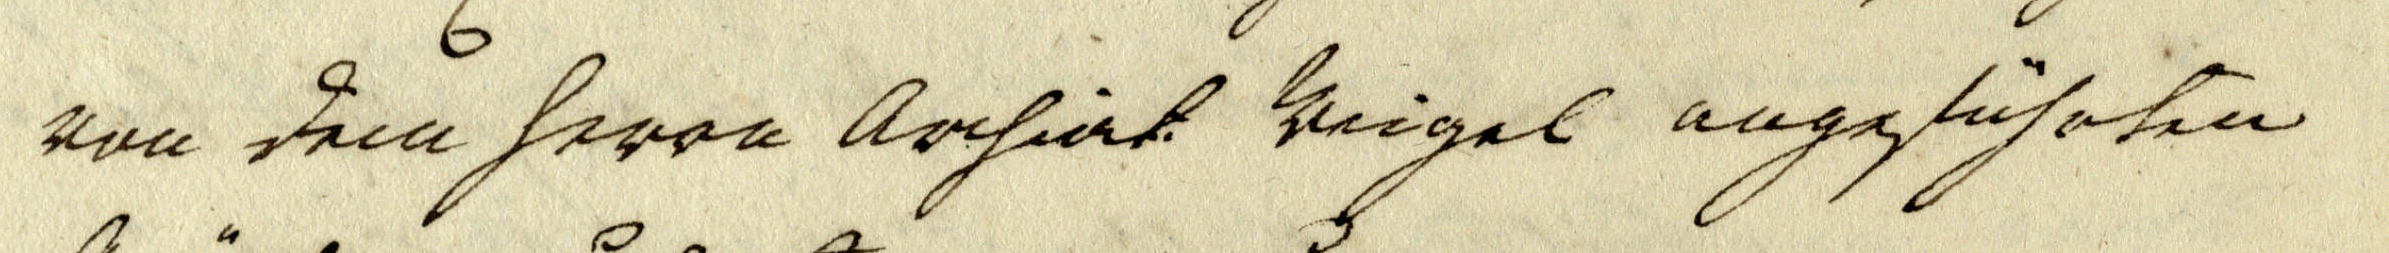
von dem Herrn Archiat. Weigel angeführten
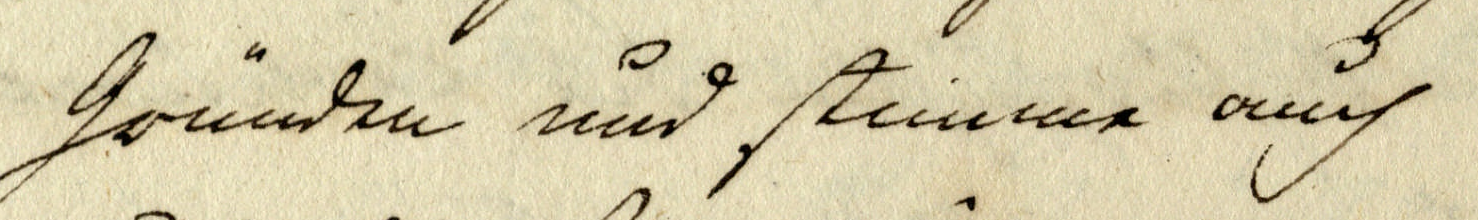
Gründen und stimme auch
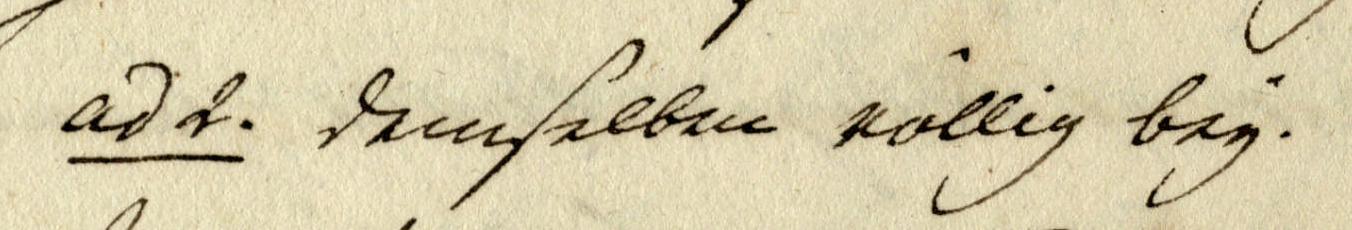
ad 2. demselben völlig beÿ.
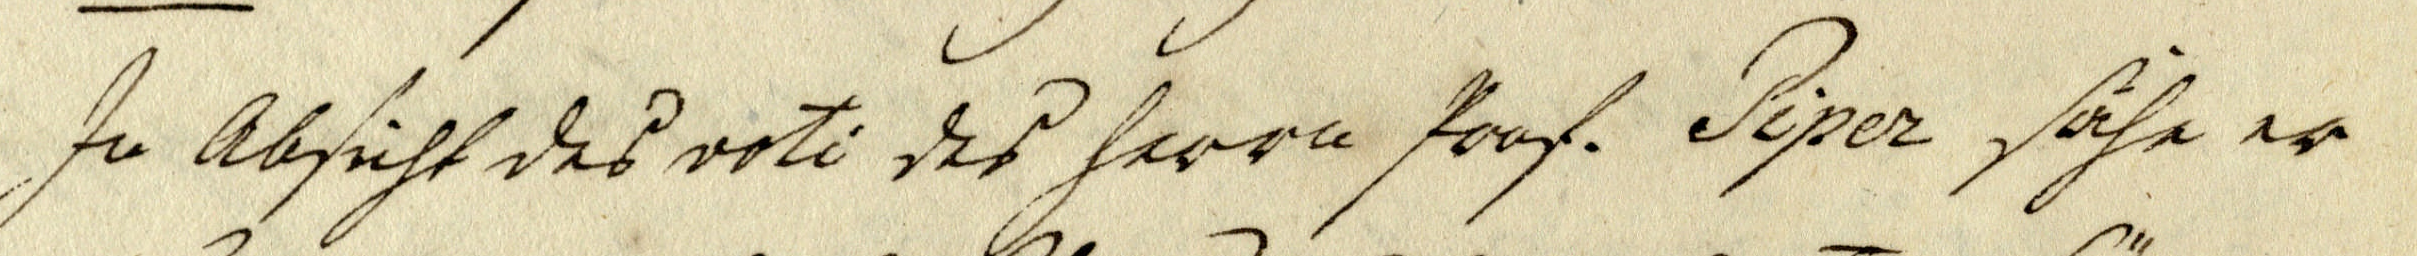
In Absicht des voti des Herrn Prof. Piper sähe er
